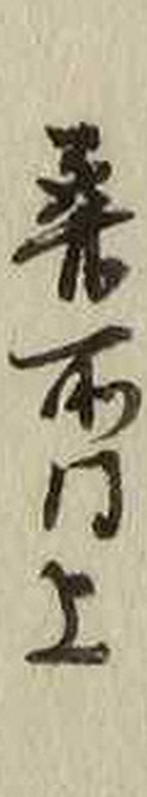母同上
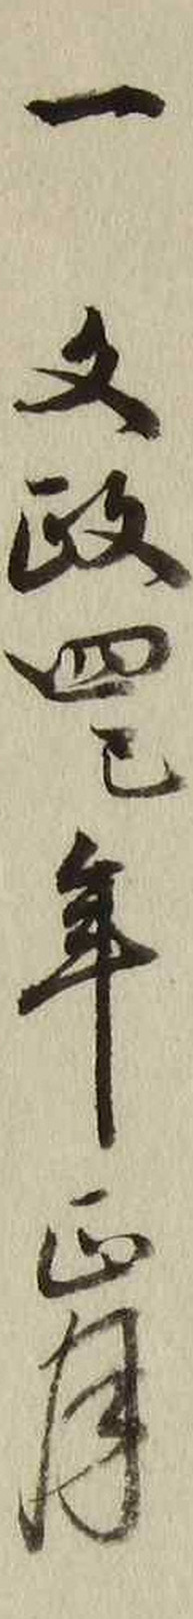一文政四巳年正月
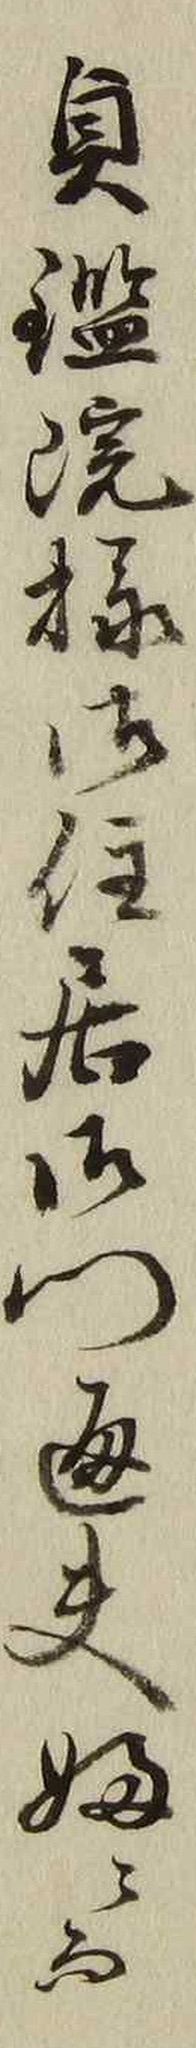貞鑑院様御住居御門通夫婦ニ而
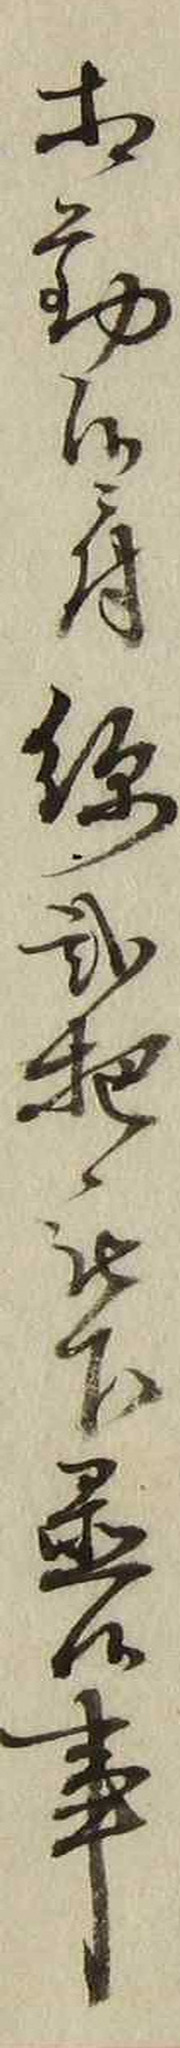相動候ニ付綿弐把被下置候事
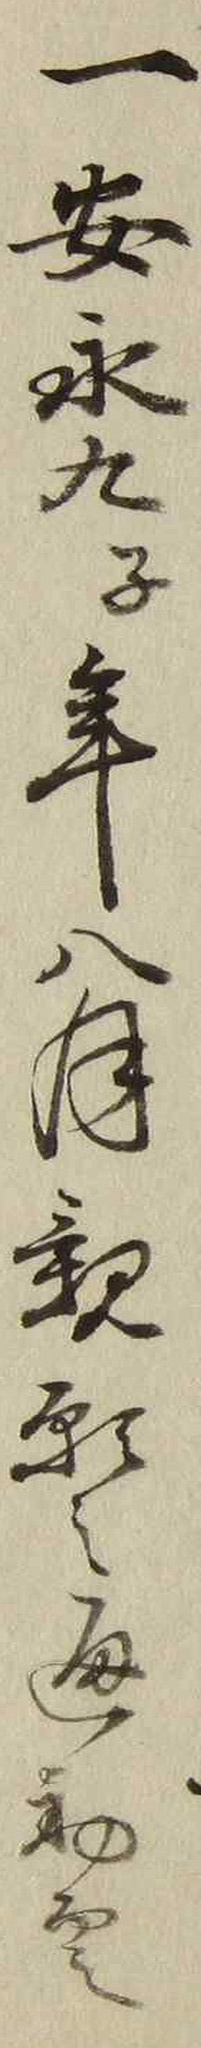一安永九子年八月親願之通初而之
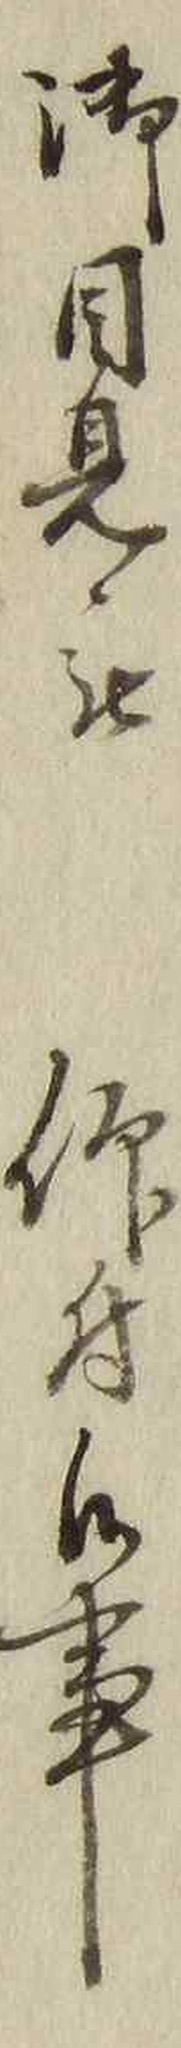御目見被仰付候事
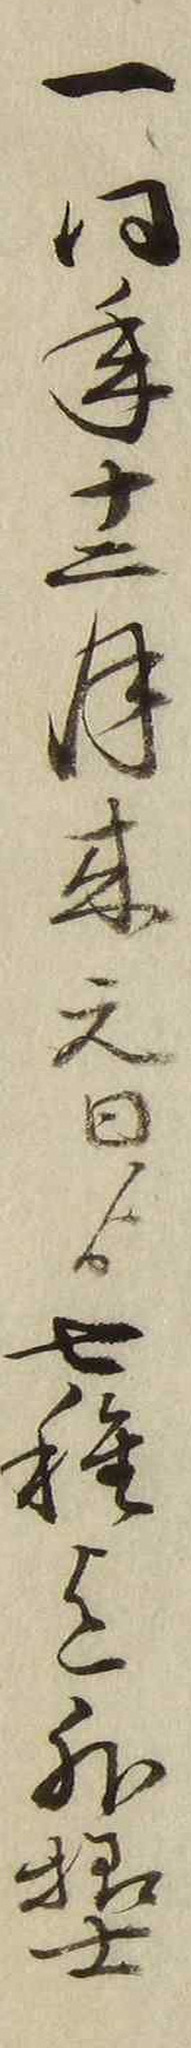一同年十二月来元日ゟ七種迄外様士

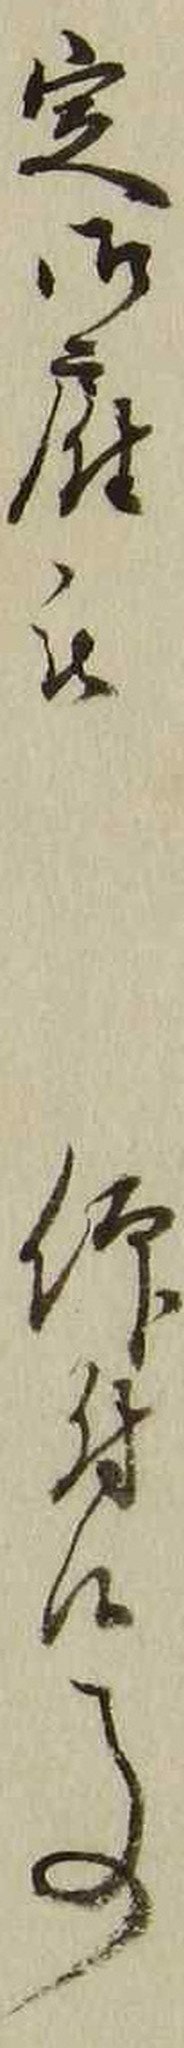定御雇被仰付候事
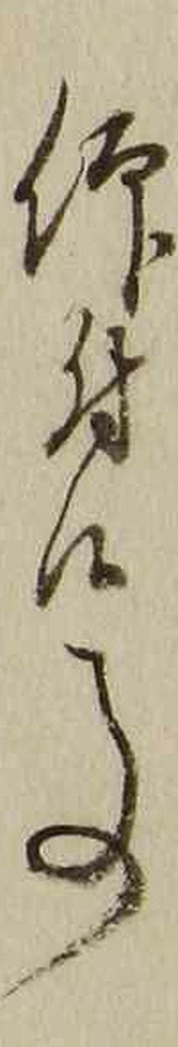仰付候事
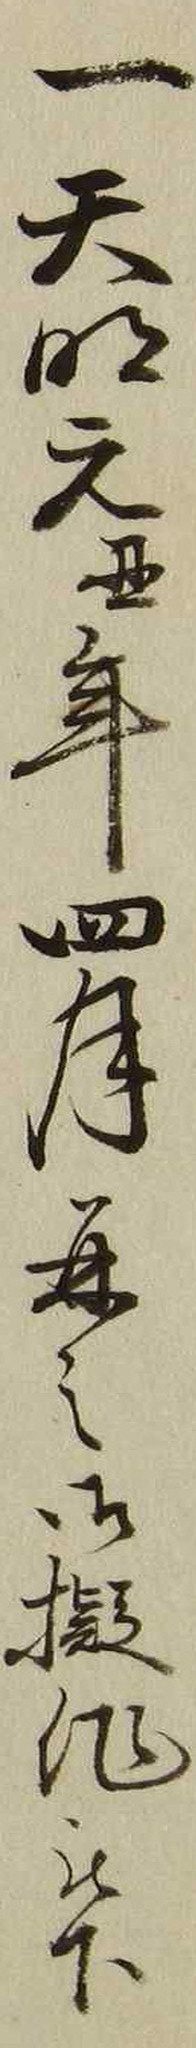一天明元丑年四月再之御擬作被下
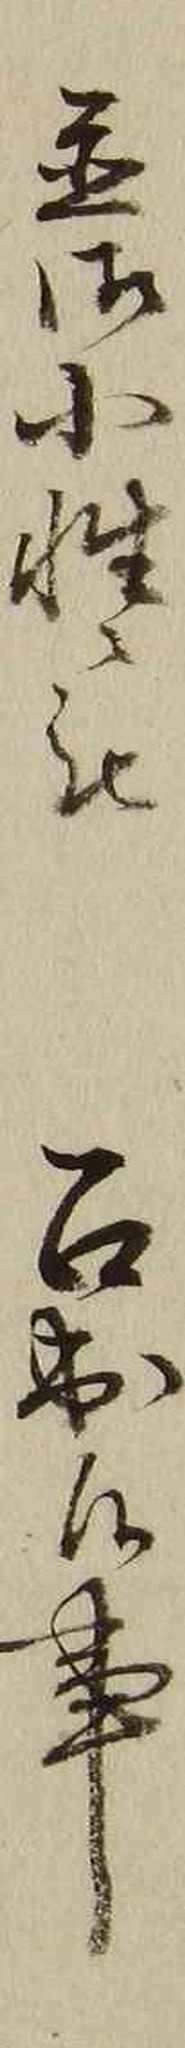置御小性ニ被召出候事
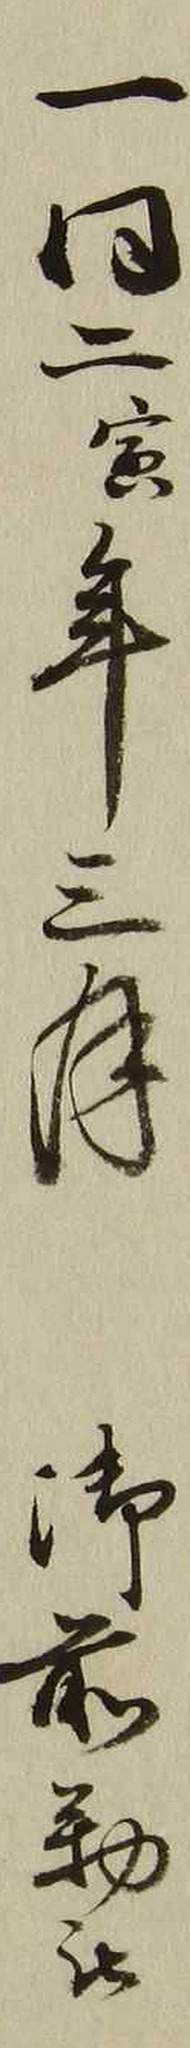一同二寅年三月御前勤被
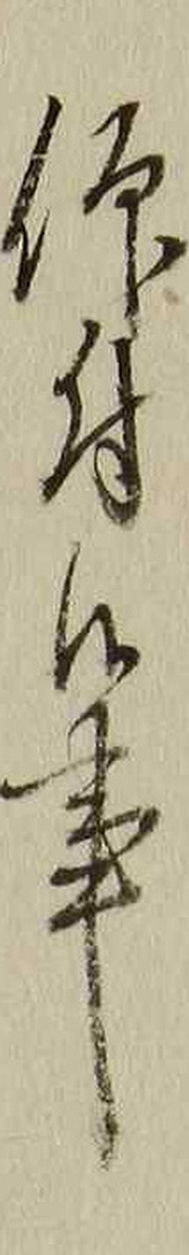仰付候事
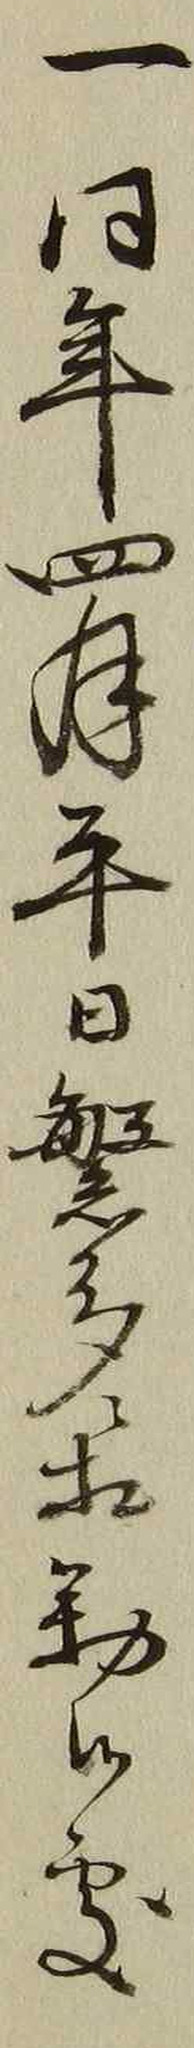一同年四月平日繁多ニ相勤候処
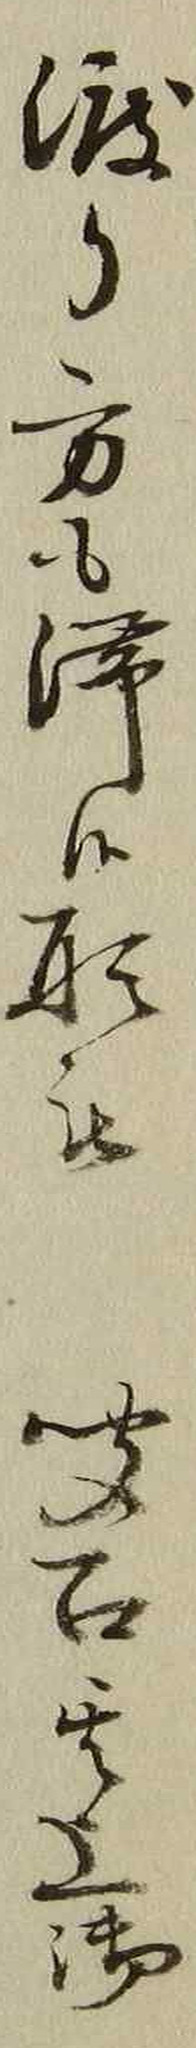渡り方も滞候形被聞召其上御
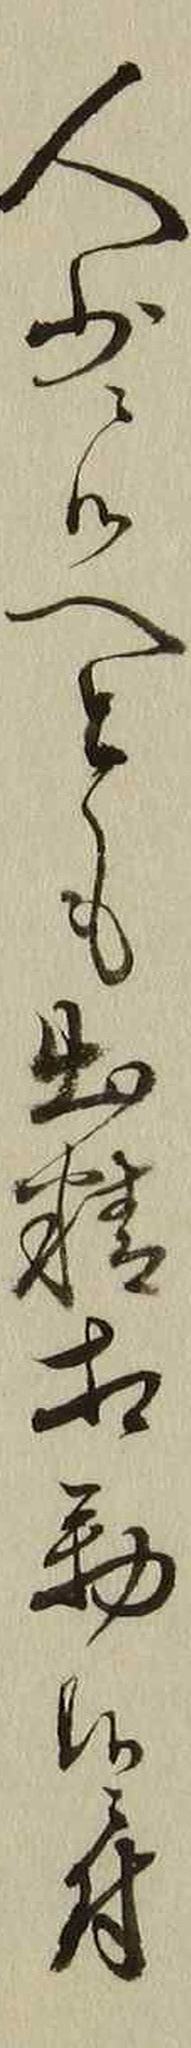人少ニ候へとも出精相勤候ニ付
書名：諸士系譜　巻之35　は之部3
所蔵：会津若松市立会津図書館
